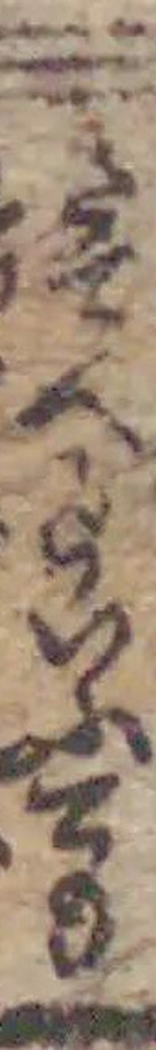さて人事いふても
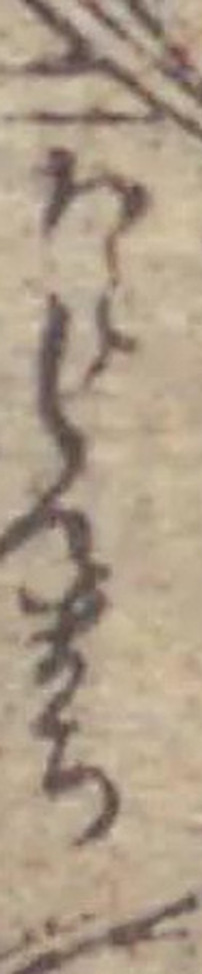かうしんまち
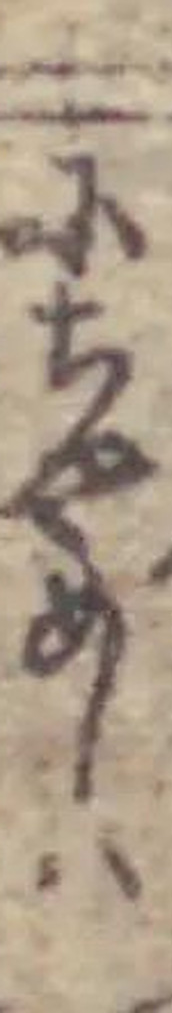にちやめしは
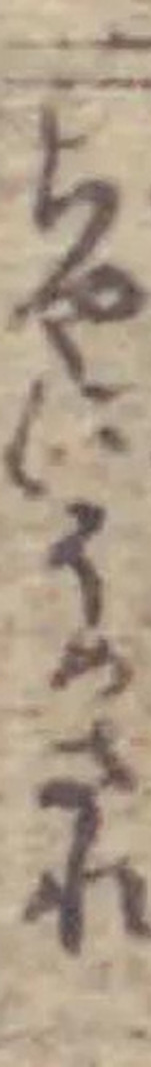ちやにうかされ
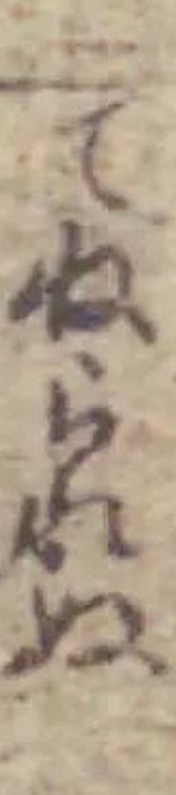てねられぬ
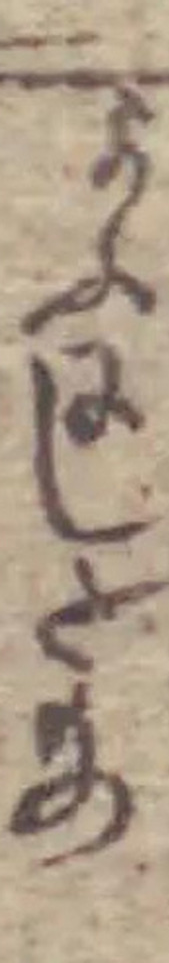よふにしたもの

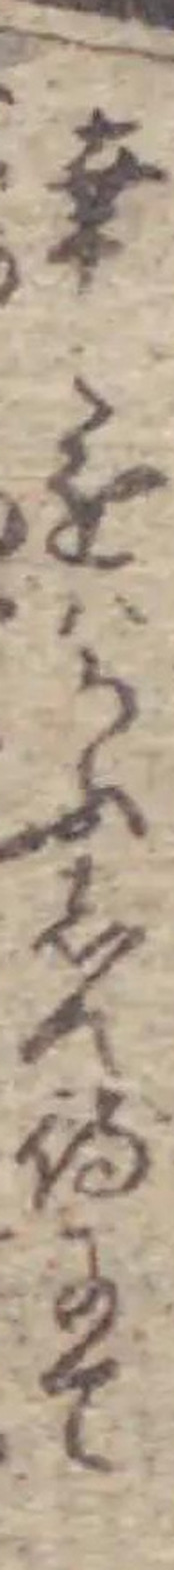幸之進はかうしん待にて
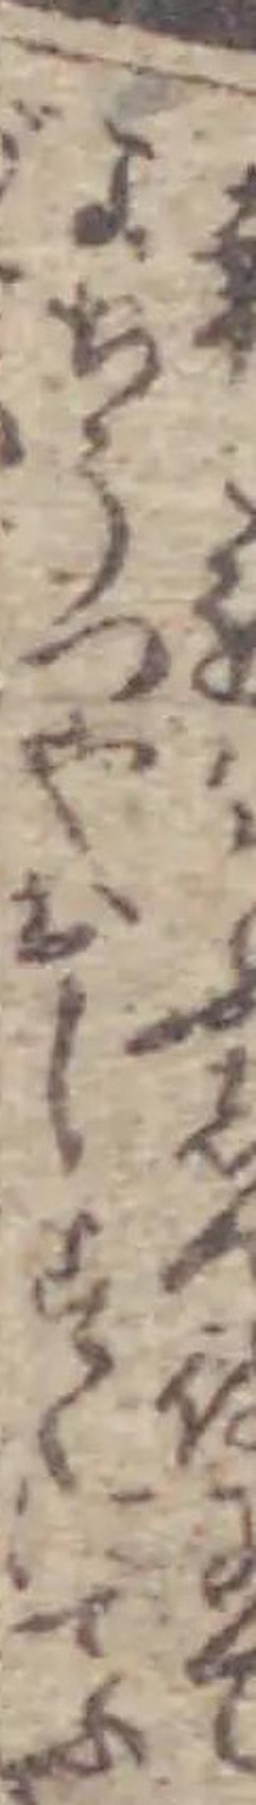よちうつやおしすくにてふ
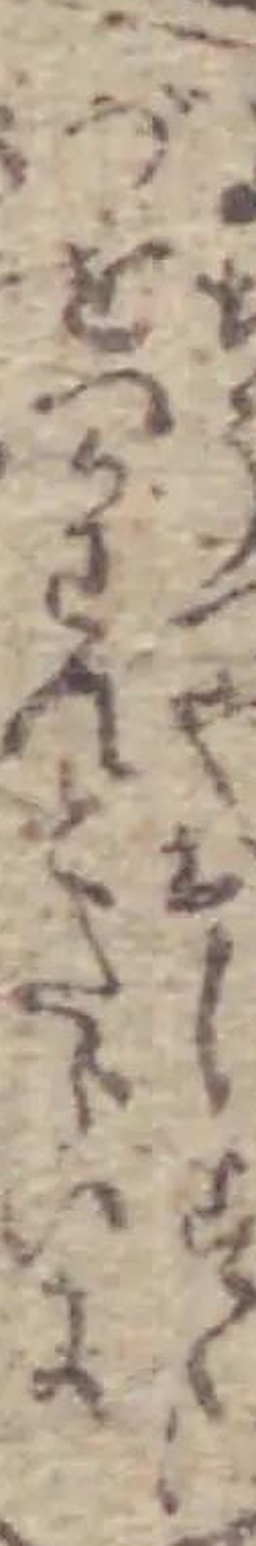づをつかわんとたらいに
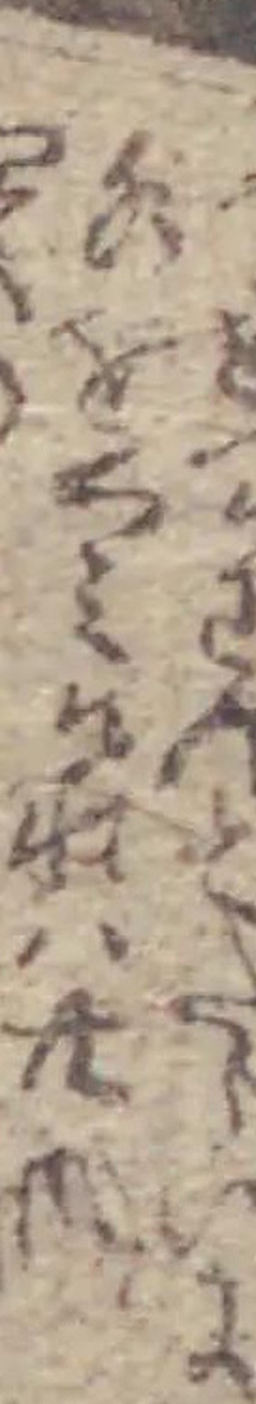水をくみけれは廿
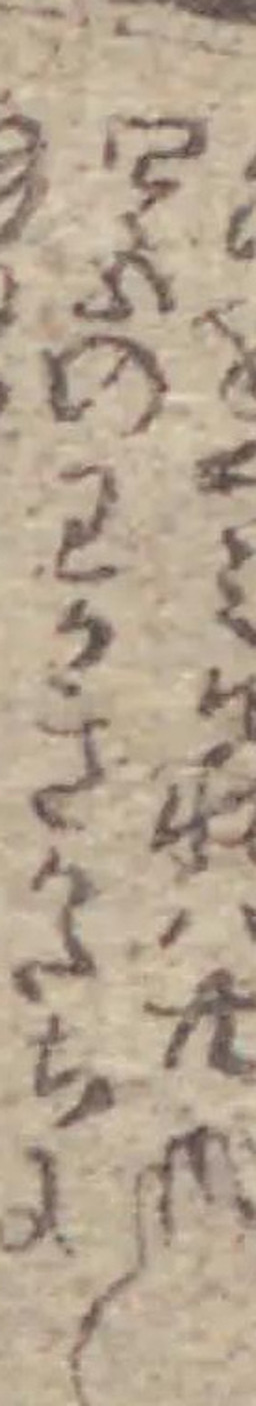四五のわかきかたちに
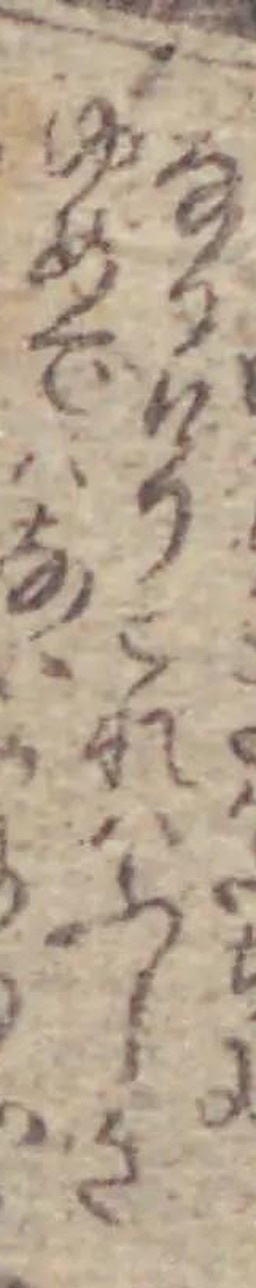ゆめではないかよもや
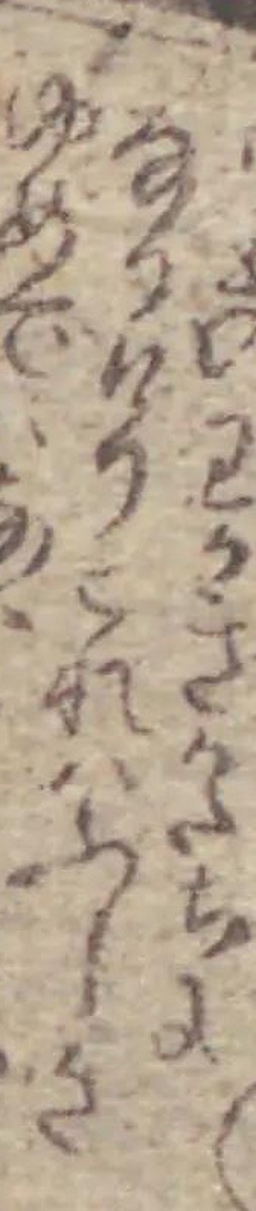なりけりこれはふしき
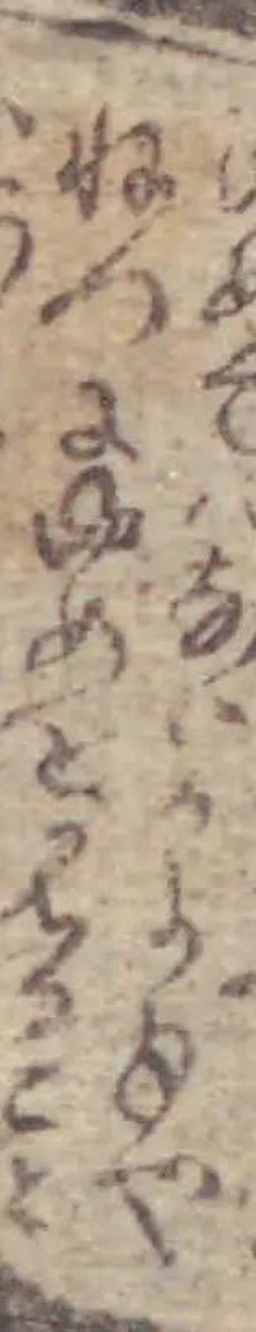ねつにゆめを見ること
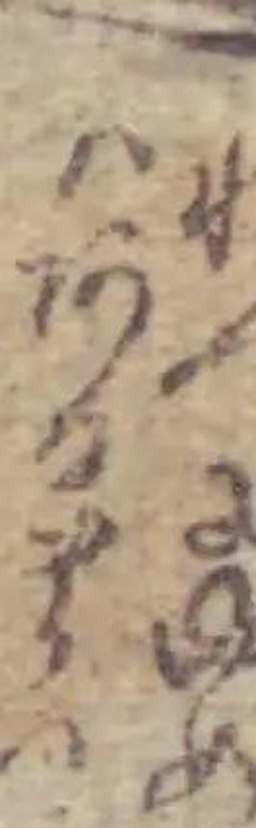はあるまい
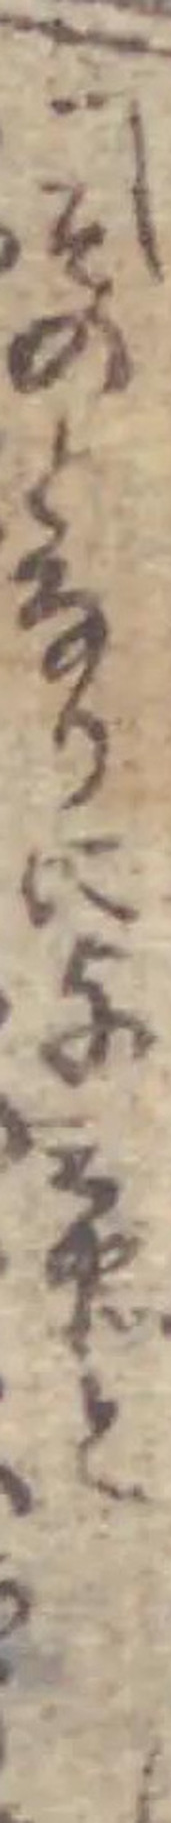「そのとなりに与兵衛と
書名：日待御利生此ごろ噂 3巻
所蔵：国立国会図書館 National Diet Library, JAPAN
